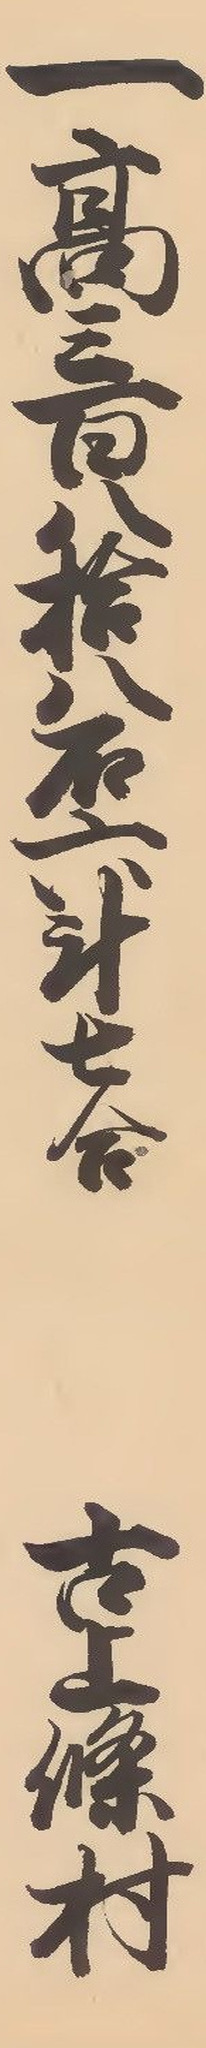一高三百八拾八石六斗七合古上条村
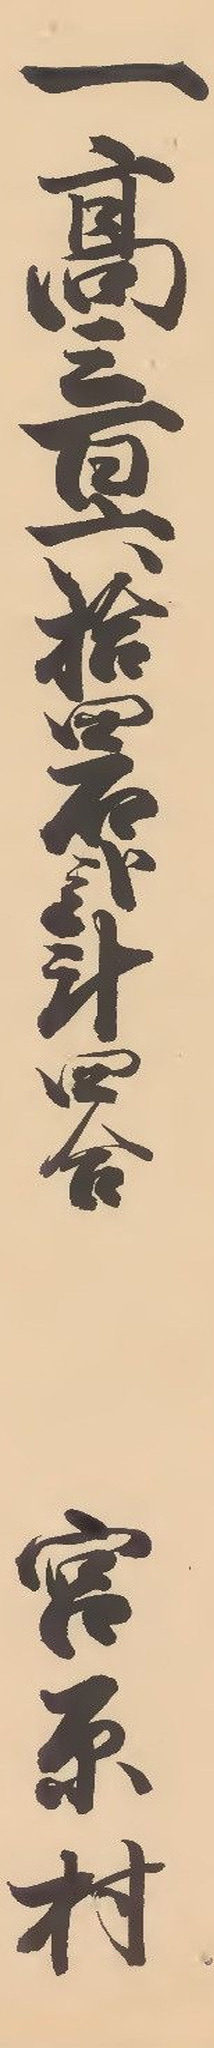一高三百六拾四石弐斗四合宮原村
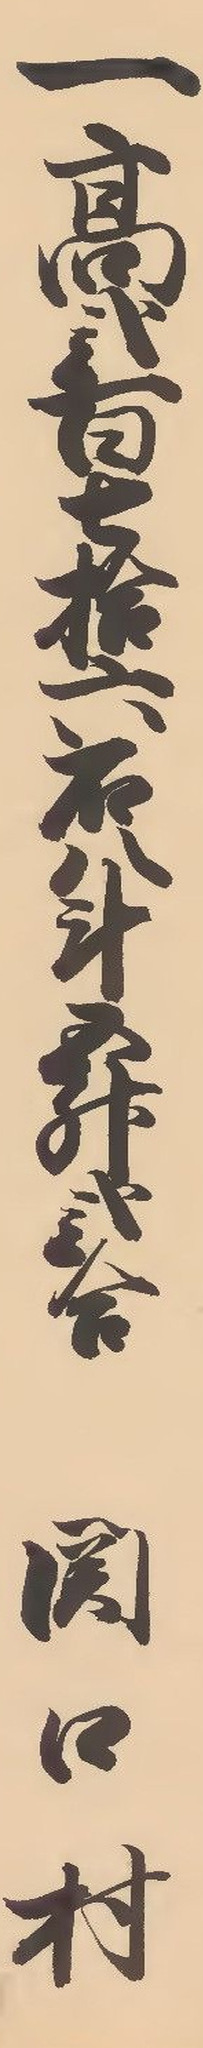一高弐百七拾六石八斗五升弐合関口村
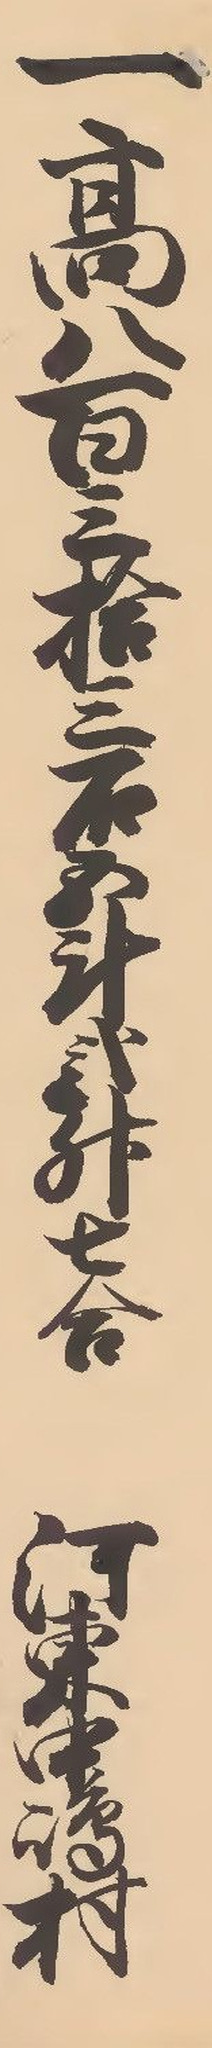一高八百三拾三石五斗弐升七合河東中島村
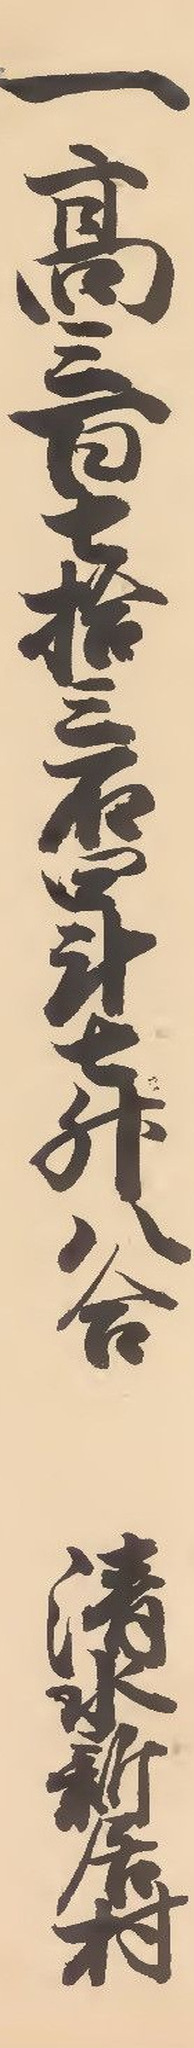一高三百七拾三石四斗七升八合清水新居村
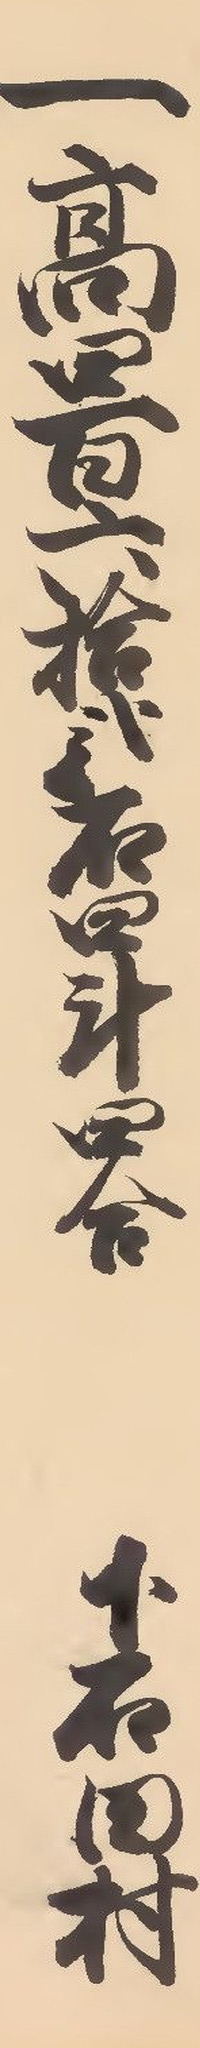一高四百六拾弐石四斗四合下石田村
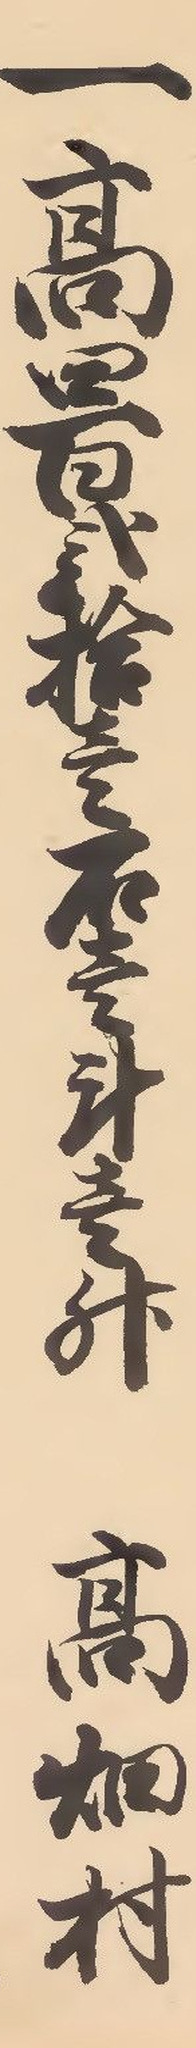一高四百弐拾壱石壱斗壱升高畑村
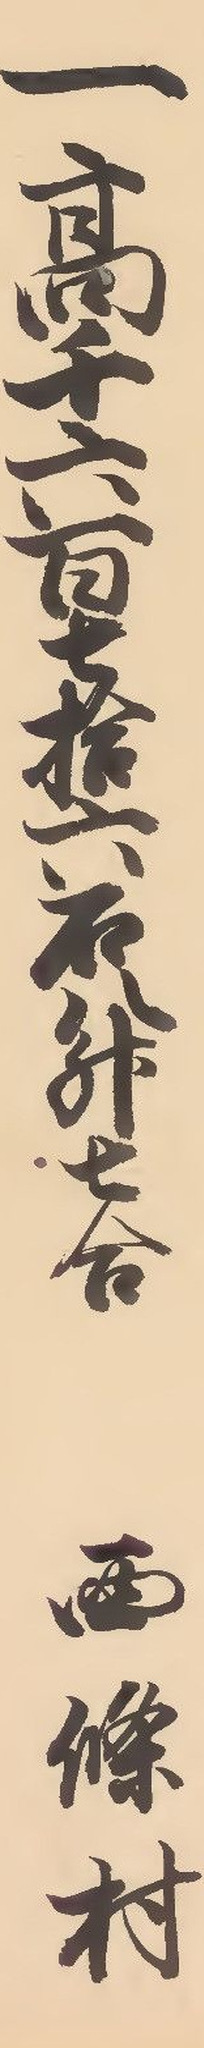一高千六百七拾六石八升七合西条村

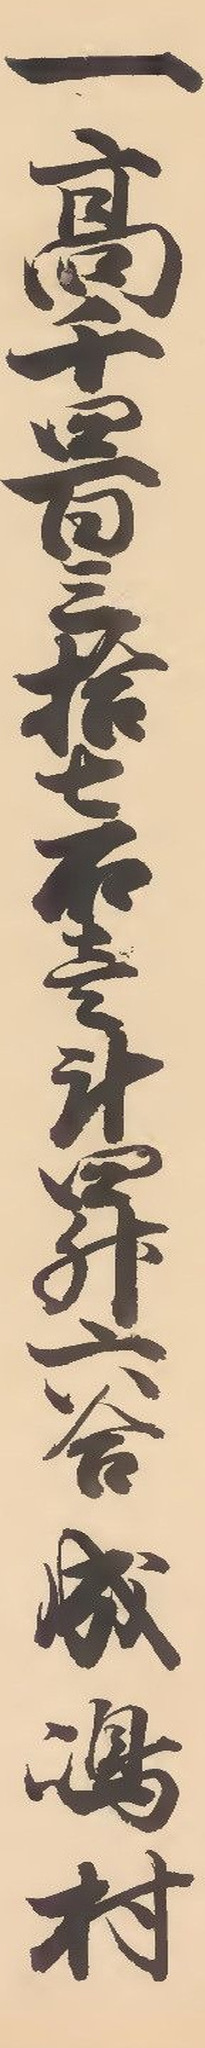一高千四百三拾七石壱斗四升六合成島村
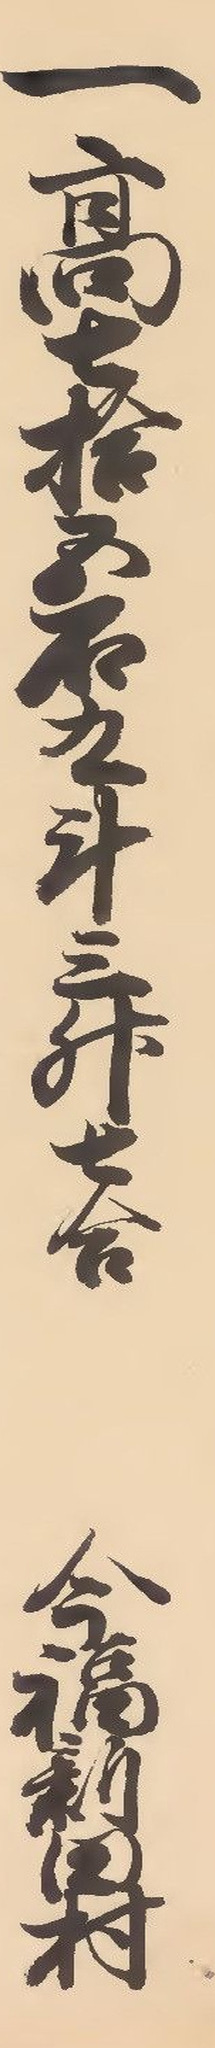一高七拾五石九斗三升七合今福新田村
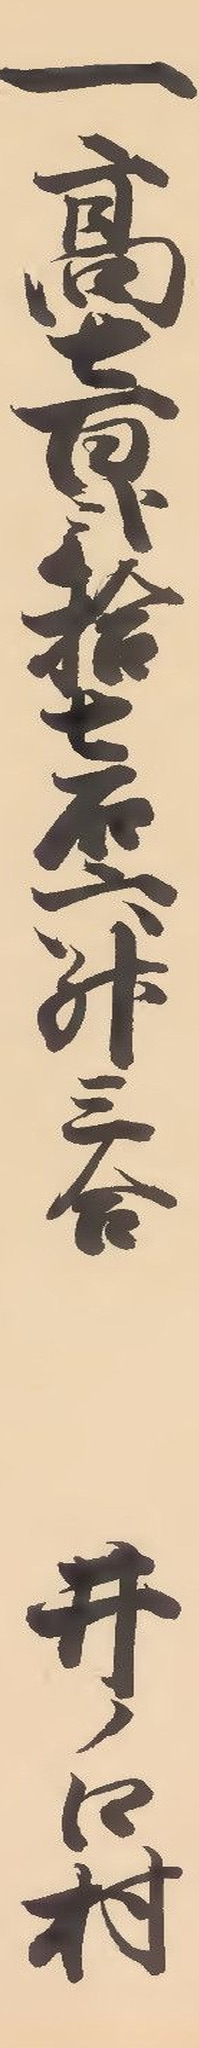一高七百弐拾七石六升三合井ノ口村
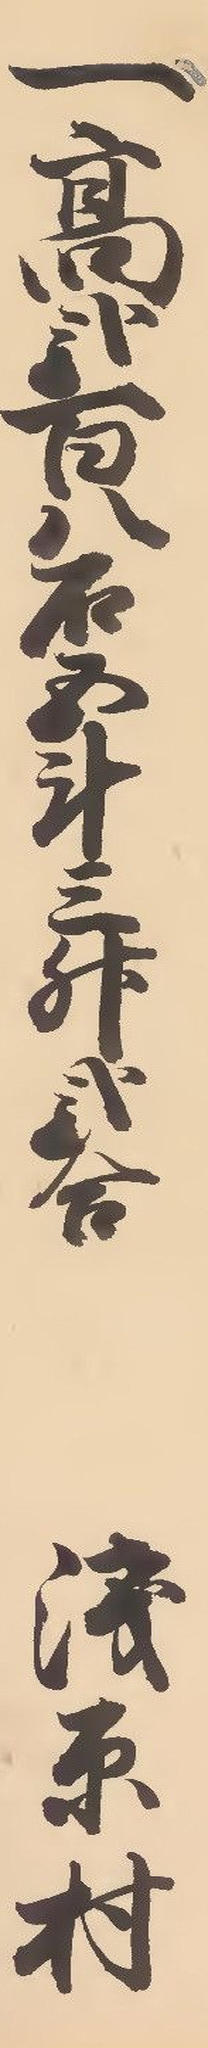一高弐百八石五斗三升弐合浅原村
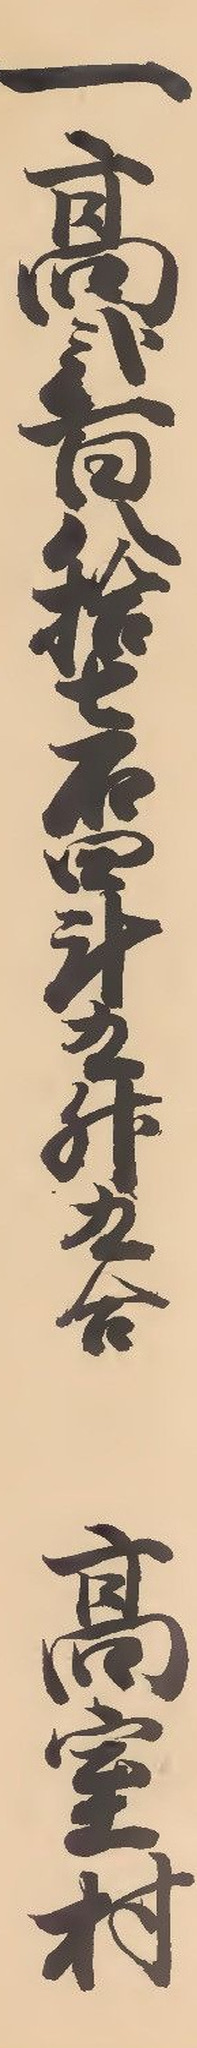一高弐百八拾七石四斗九升九合高室村
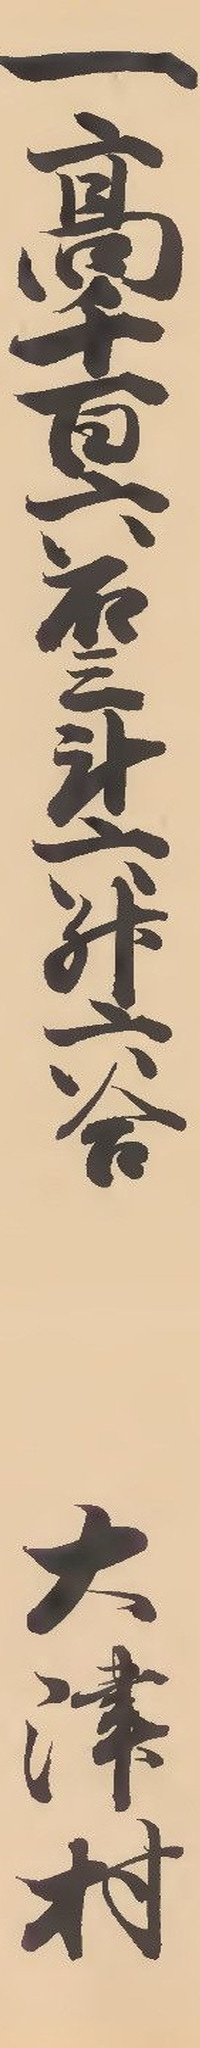一高千百六石三斗六升六合大津村
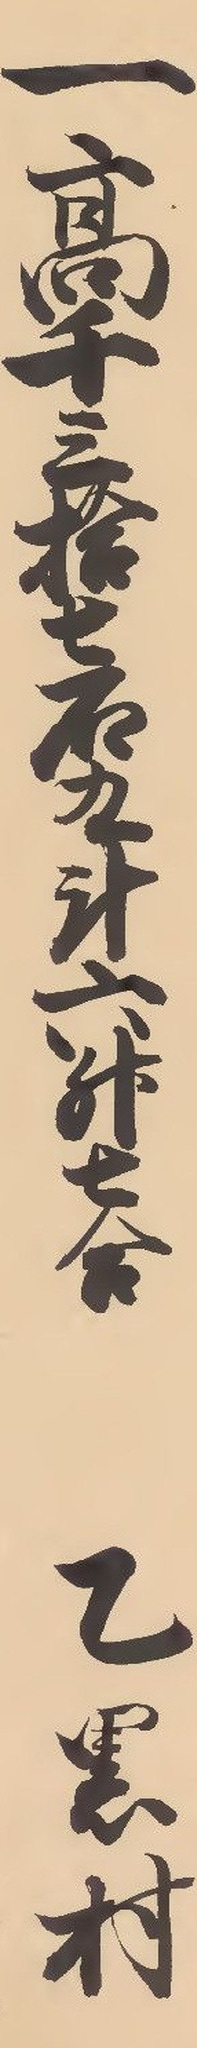一高千三拾七石九斗六升七合乙黒村
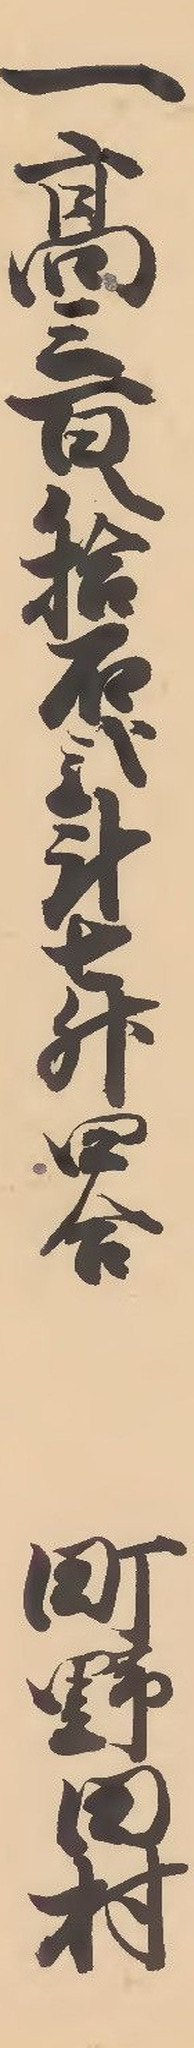一高三百八拾石弐斗七升四合町野田村
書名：甲斐国郷帳
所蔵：国立公文書館 National Archives of Japan
